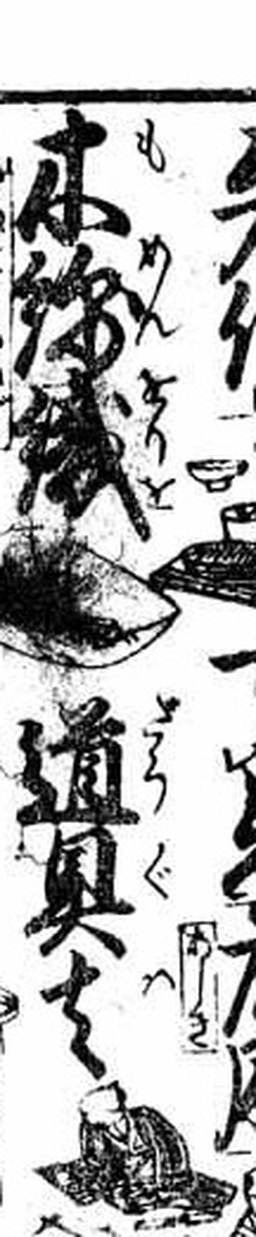木綿織道具者攪
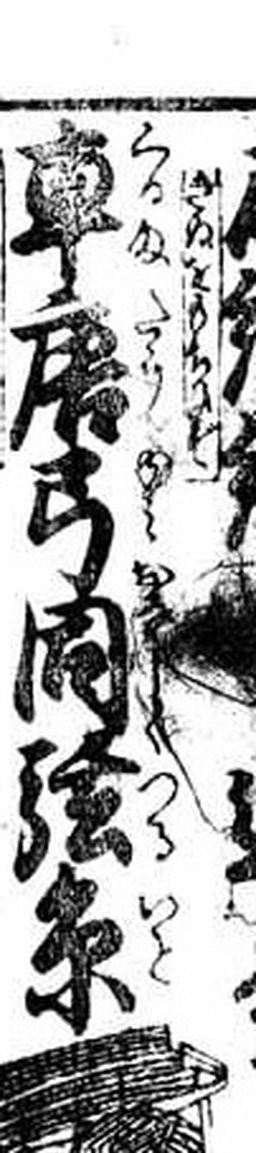車唐弓同弦糸車

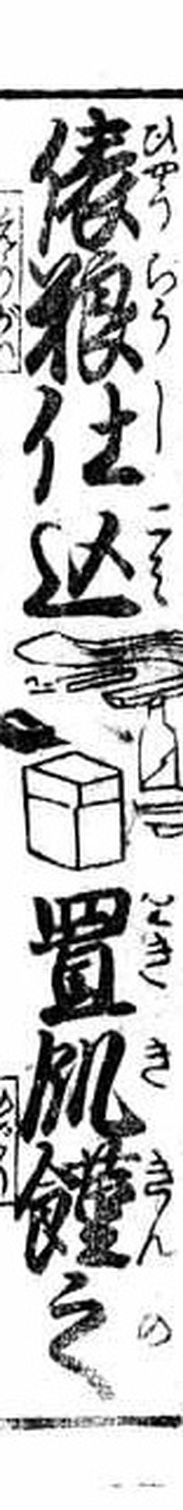俵粮仕込置飢饉之
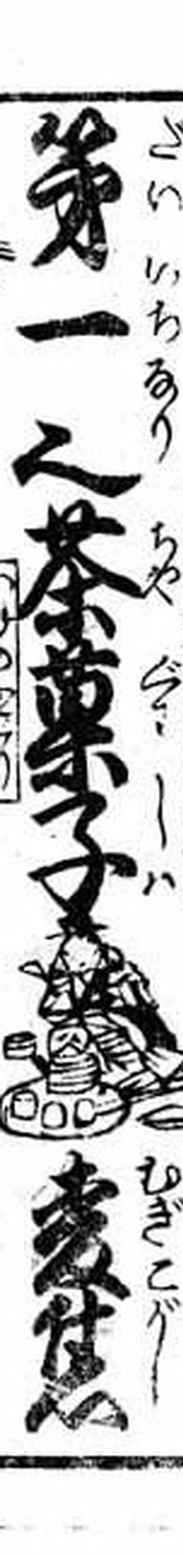第一也茶菓子麦焦
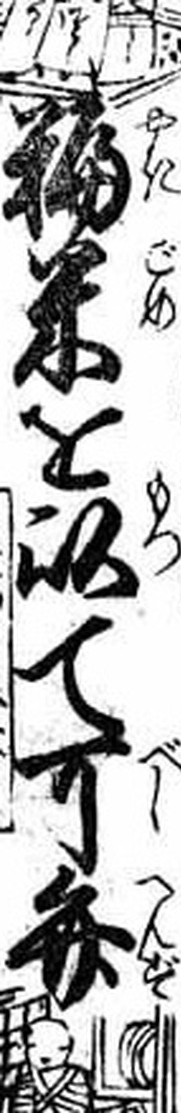糄米を以て可弁

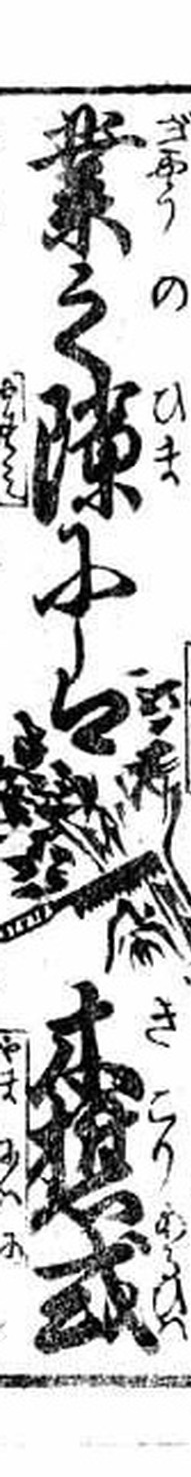業之隙には木樵或

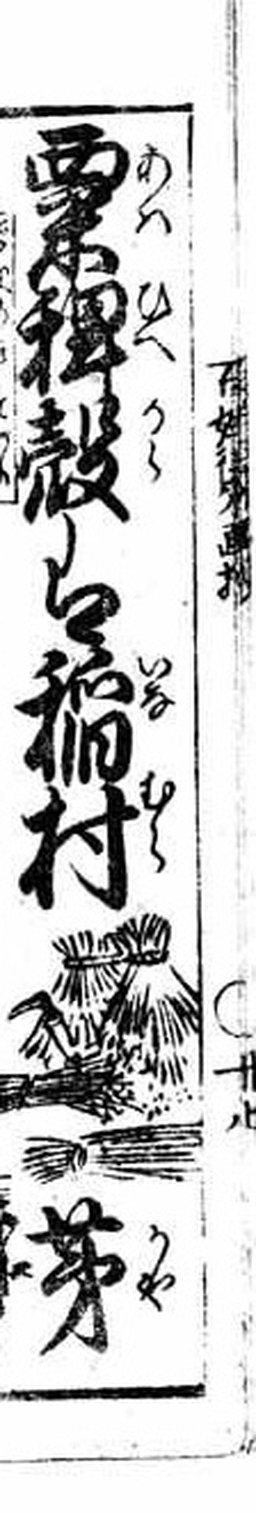粟稗殻は稲村茅
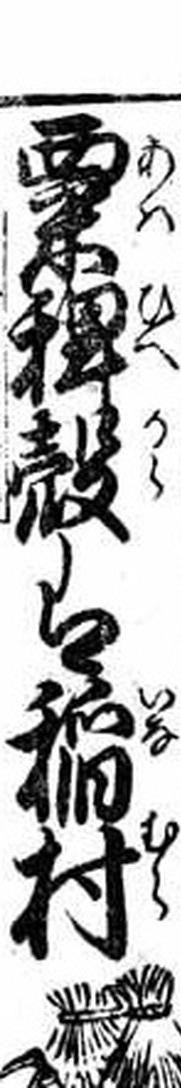粟稗殻は稲村茅
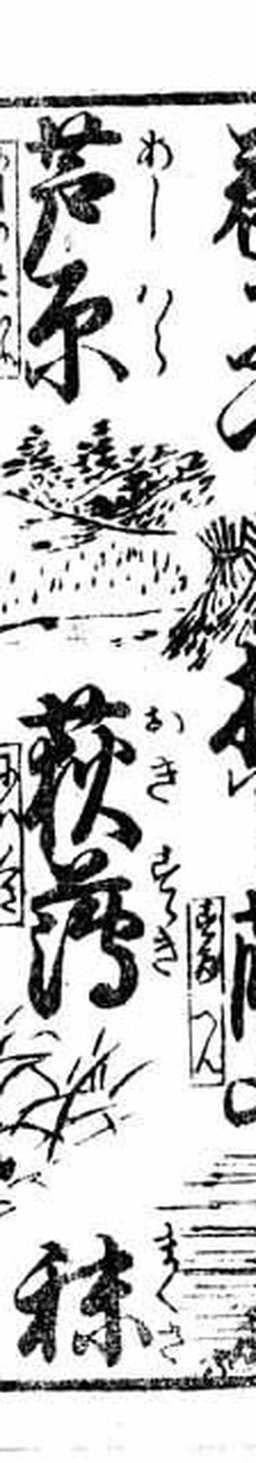芦原荻薄秣
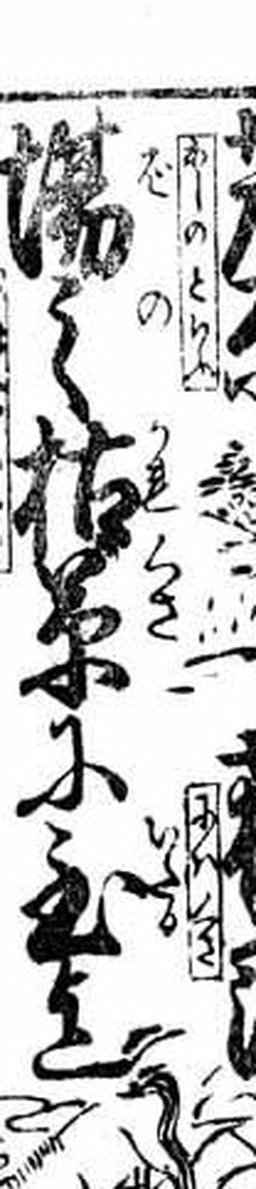場之枯草に至迄刈
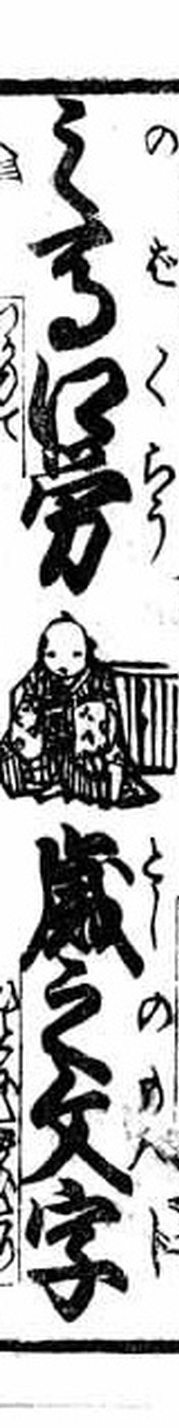之馬口労歳之文字

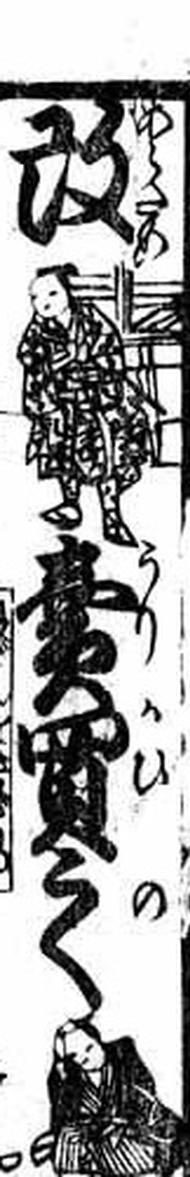改売買之名

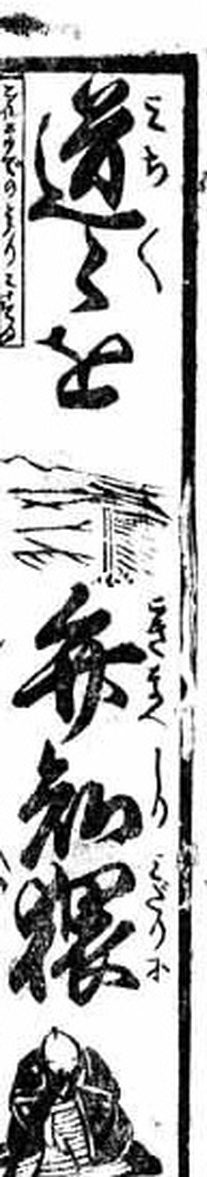道々を弁知猥
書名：百姓往来画抄
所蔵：東京学芸大学教育コンテンツアーカイブ
